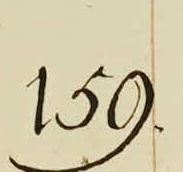159
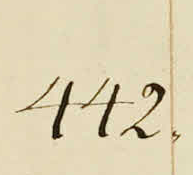442
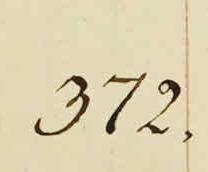372
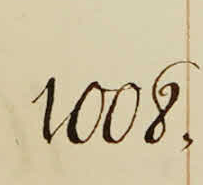1008
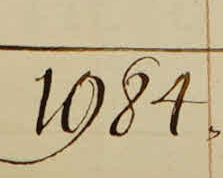1984
